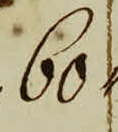60
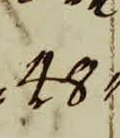48
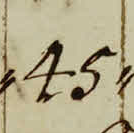45
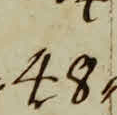48
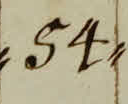54
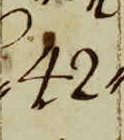42
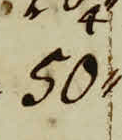50
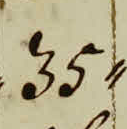35
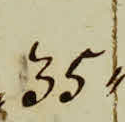35
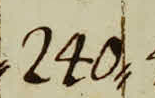240
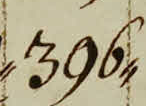396
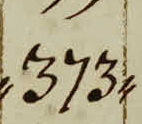373
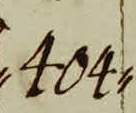404
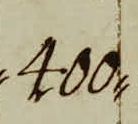400
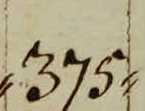375
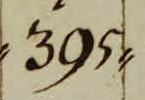395
